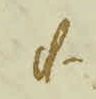8
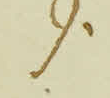9
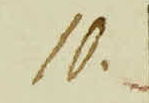10.
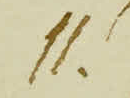11.
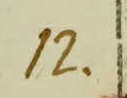12.
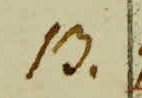13.
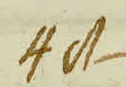48
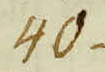40
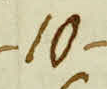10
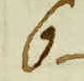6
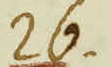26
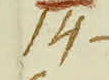14
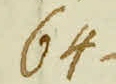64
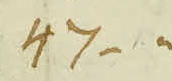47 -
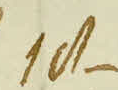18
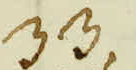33
